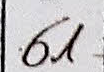61
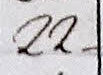22
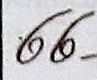66
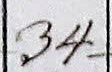34
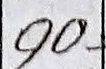90
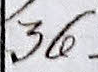36
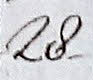28
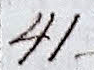41
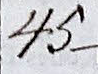45
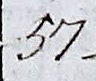57
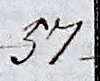57
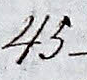45
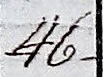46
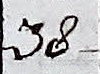38
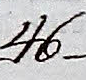46
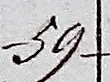59
